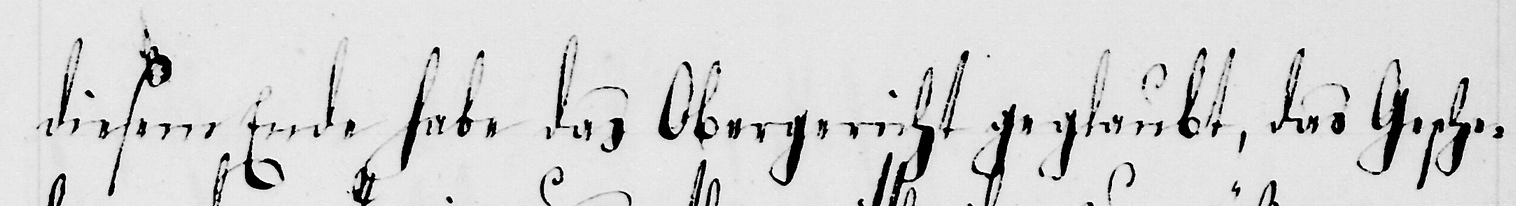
diesem Ende habe das Obergericht geglaubt, das Gesche¬
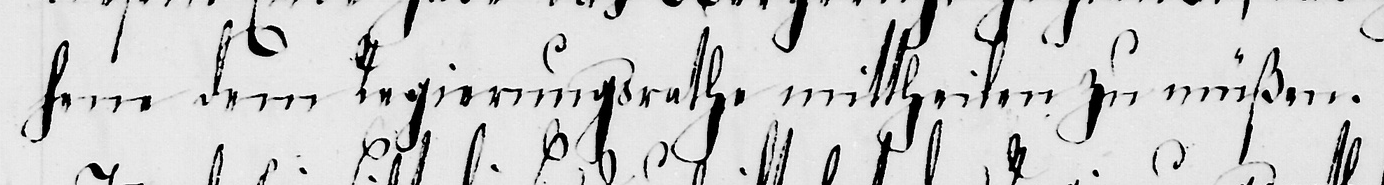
hene dem Regierungsrathe mittheilen zu müßen.
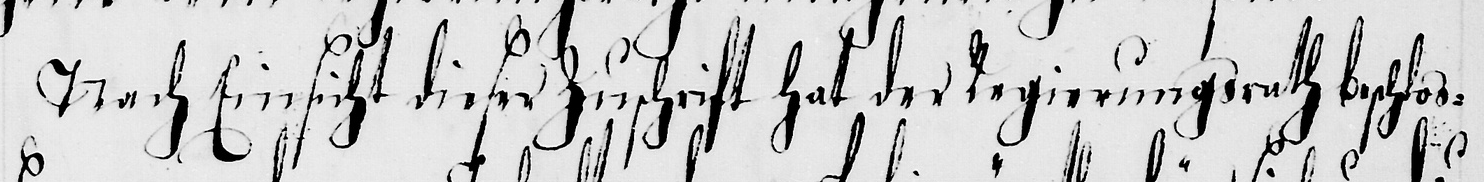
Nach Einsicht dieser Zuschrift hat der Regierungsrath beschlo¬
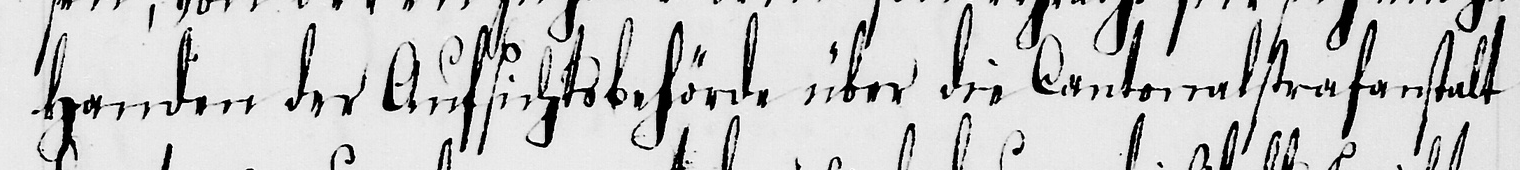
Handen der Aufsichtsbehörde über die Cantonalstrafanstalt
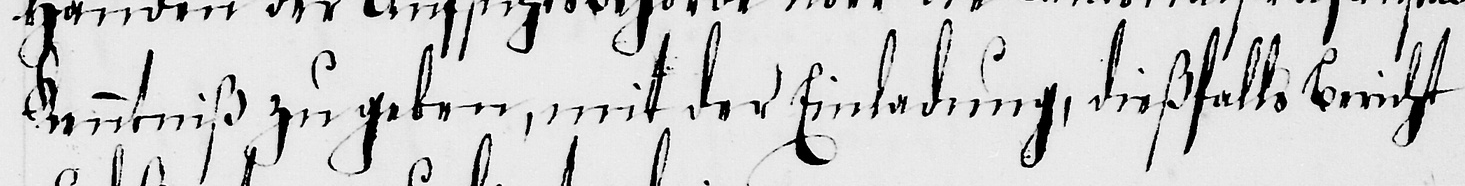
Kenntniß zu geben, mit der Einladung, dießfalls Bericht
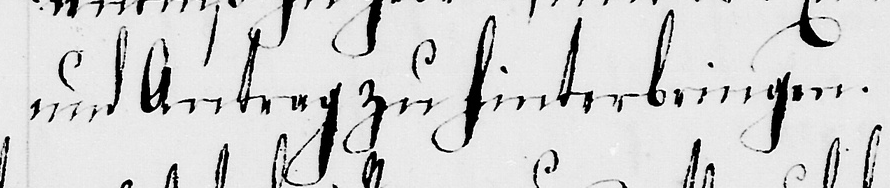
und Antrag zu hinterbringen.
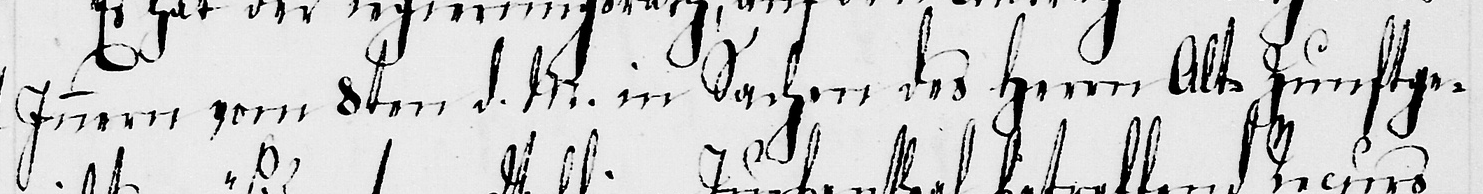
Innern vom 8ten d. M. in Sachen des Herrn Alt-Zunftge¬
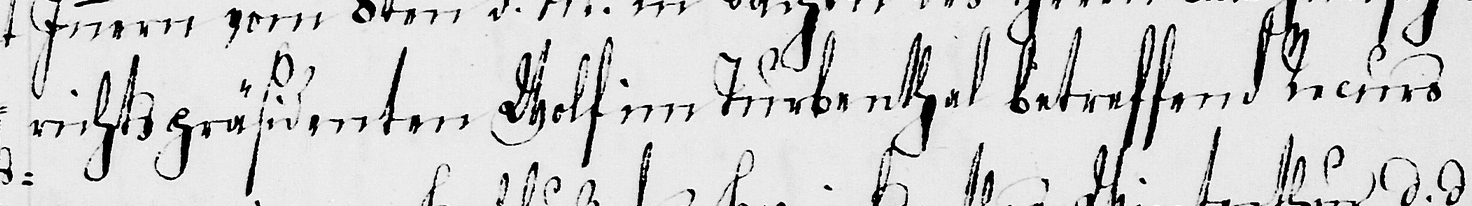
richtspräsidenten Wolf im Turbenthal betreffend Recurs
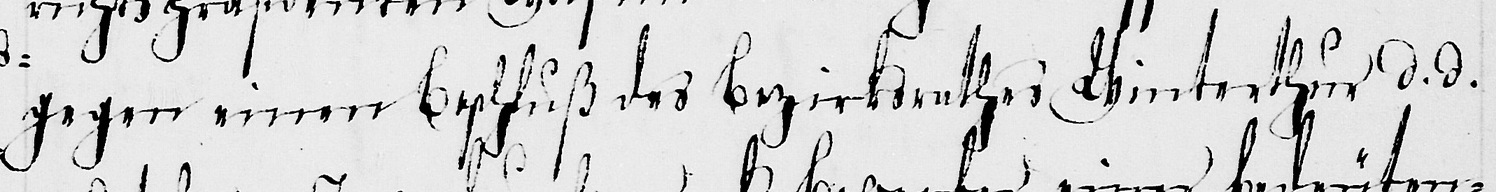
gegen einen Beschluß des Bezirksrathes Winterthur d. d.
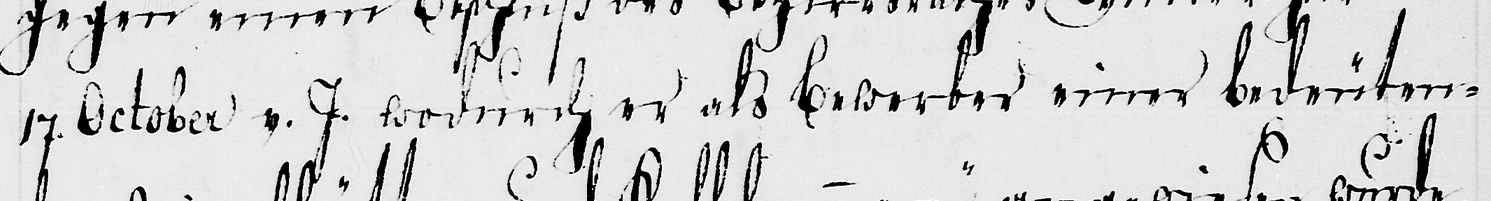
17. October v. J. wodurch er als Bewerber einer bedeuten¬
